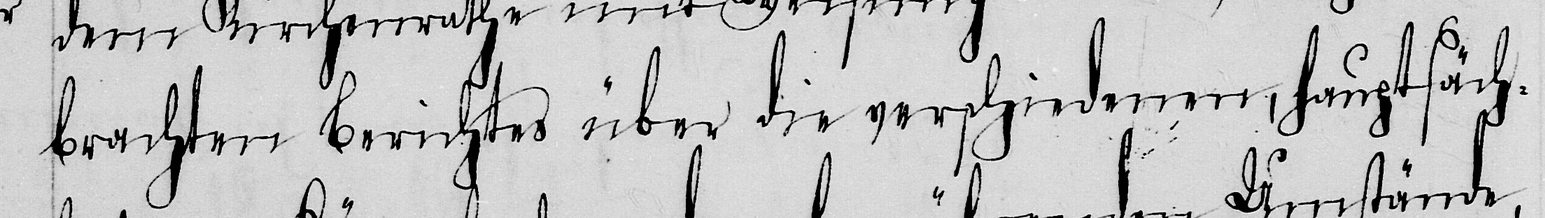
brachten Berichtes über die verschiedenen, hauptsäch¬
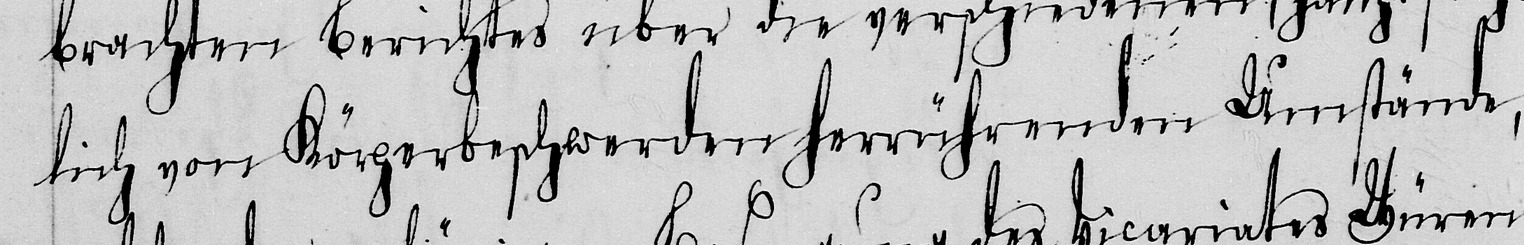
lich von Körperbeschwerden herrührenden Umstände,
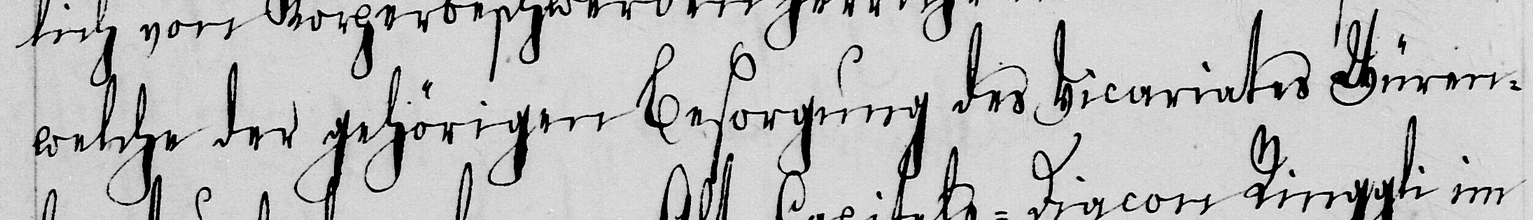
welche der gehörigen Besorgung des Vicariates Würen¬
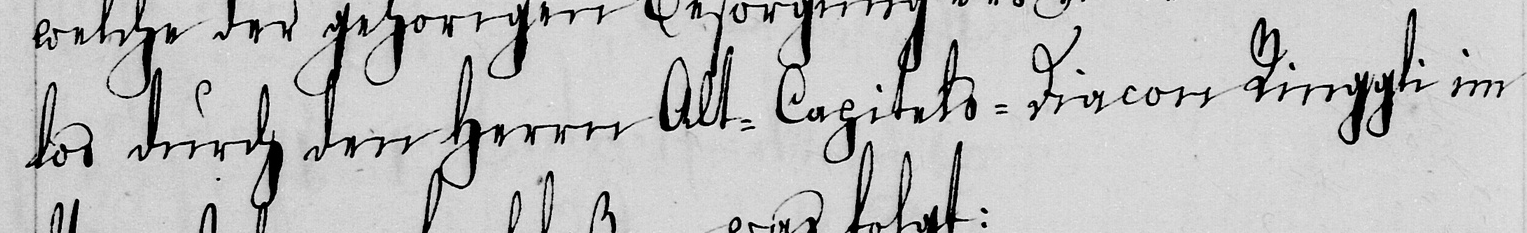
los durch den Herrn Alt-Capitels-Diacon Ringgli im
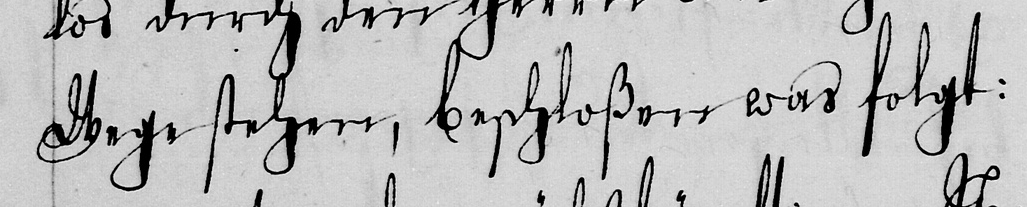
Wege stehen, beschloßen was folgt:
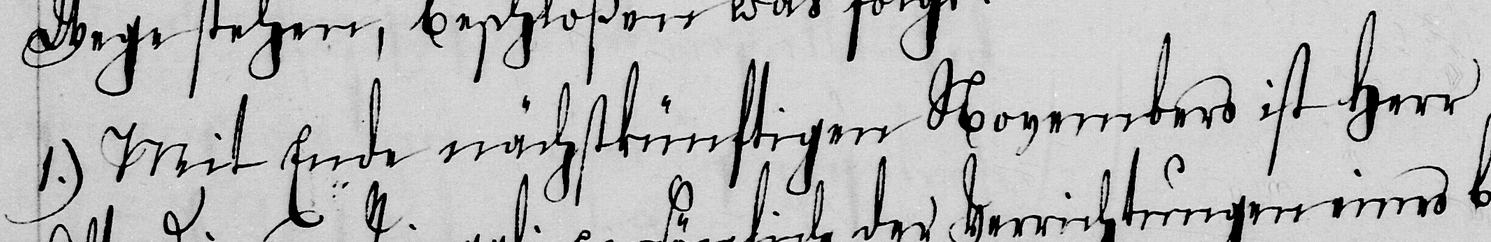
1.) Mit Ende nächstkünftigen Novembers ist Herr
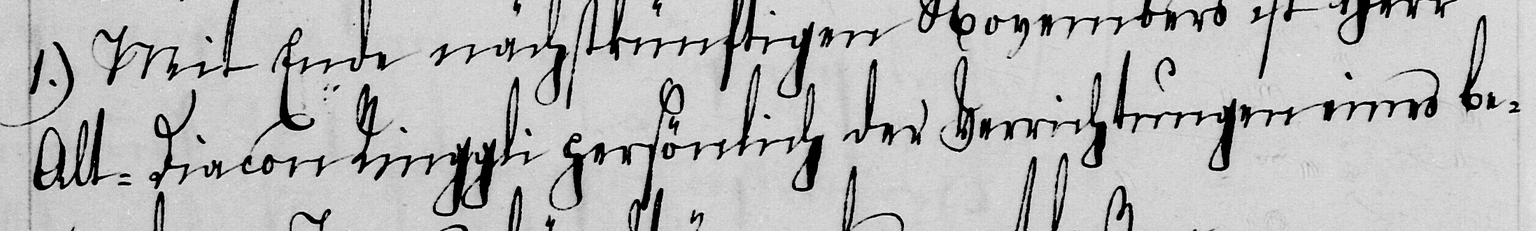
Alt-Diacon Ringgli persönlich der Verrichtungen eines be¬
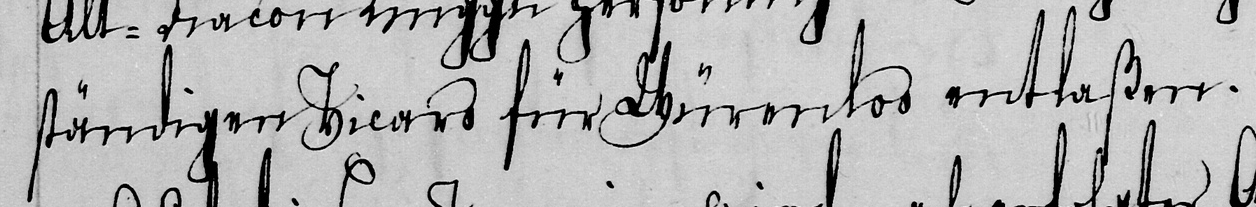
ständigen Vicars für Würenlos entlaßen.
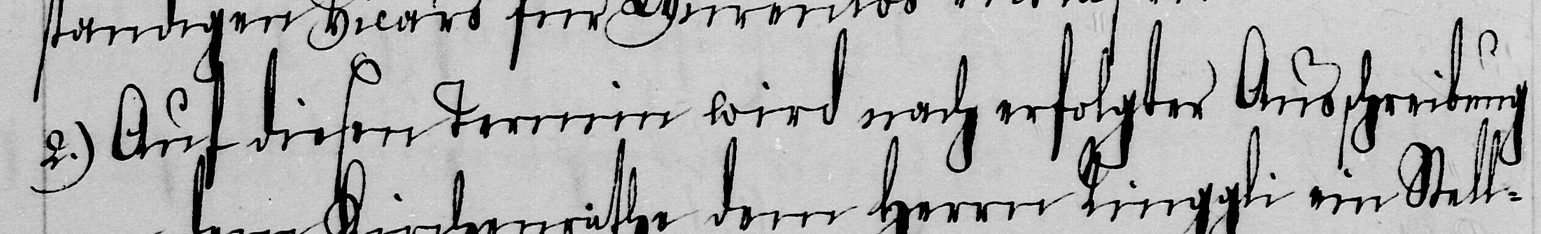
2.) Auf diesen Termin wird nach erfolgter Ausschreibu¬
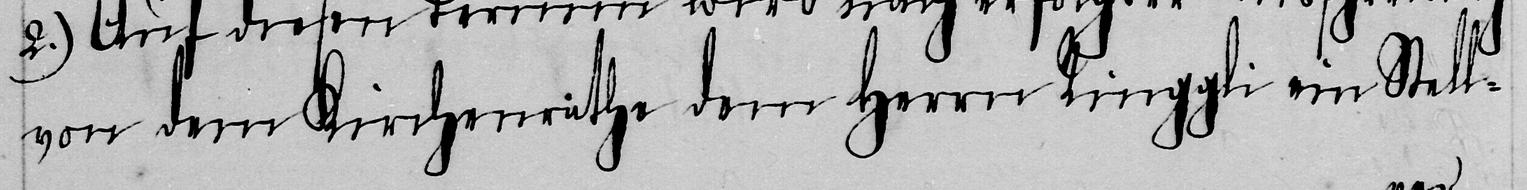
von dem Kirchenrathe dem Herrn Ringgli ein Stell-
